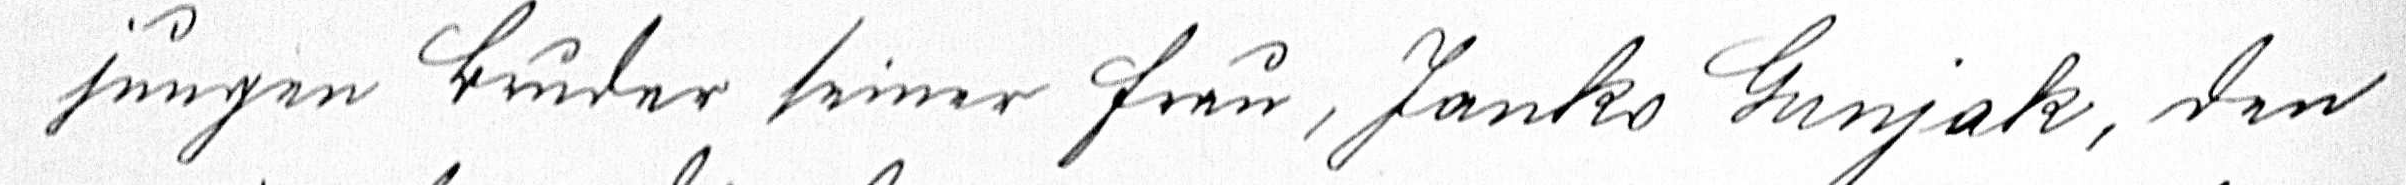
jungen Bruder seiner Frau, Janko Gunjak, den
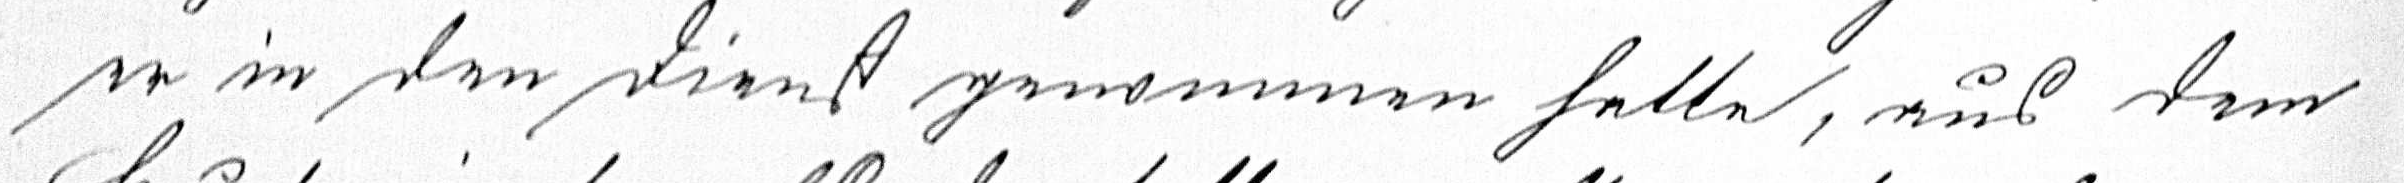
er in den Dienst genommen hatte, aus dem
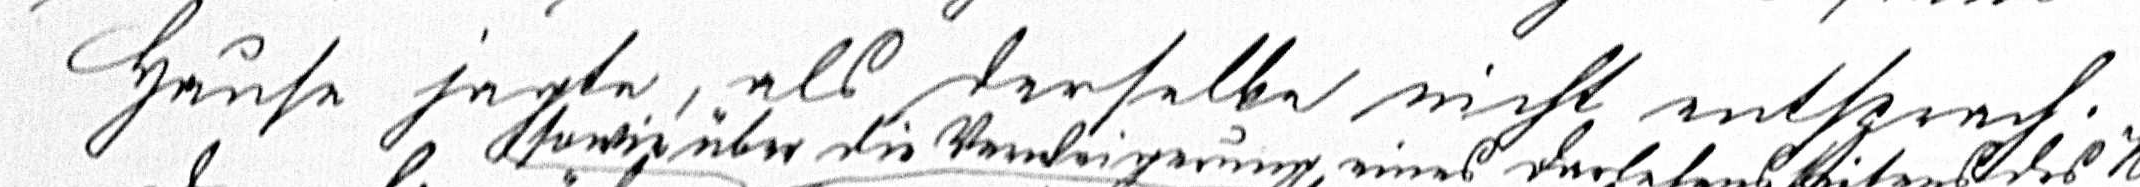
Hause jagte, als derselbe nicht entsprach.
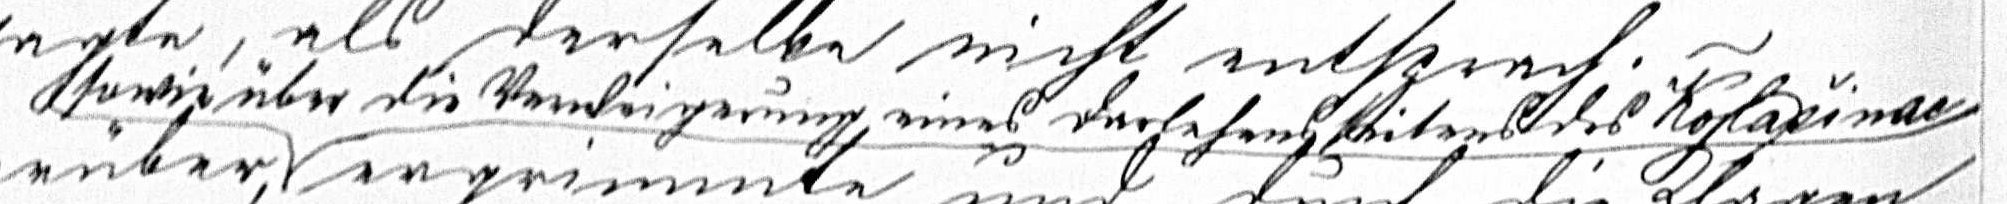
sowie über die Verweigerung eines Darlehens seitens des Kolašinac
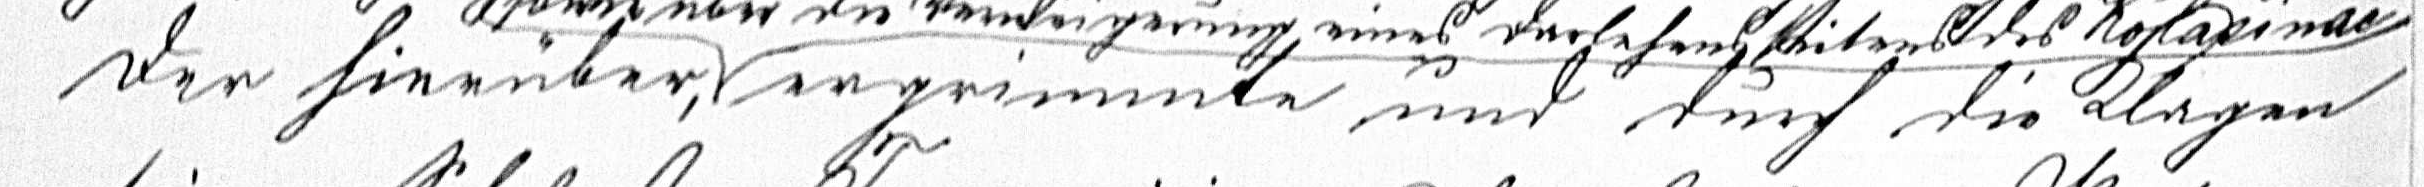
Der hierüber, ergrinnete und durch die Klagen
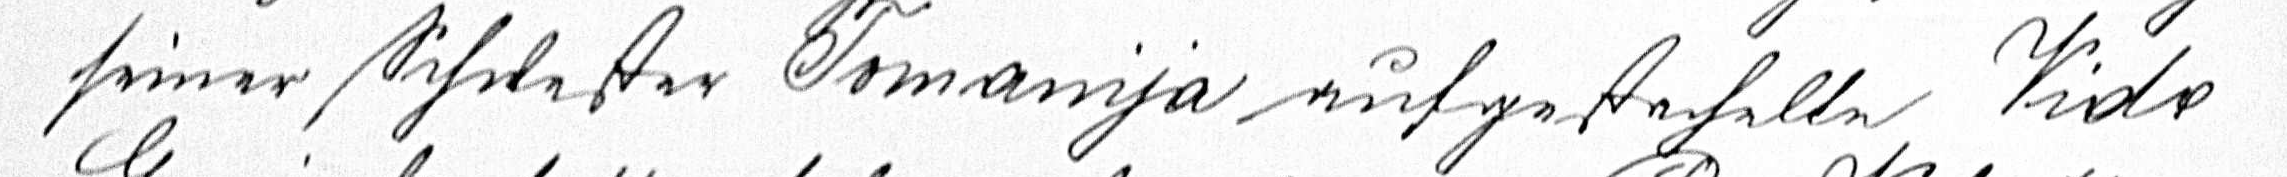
seiner Schwester Tomanija aufgestechelte Vide
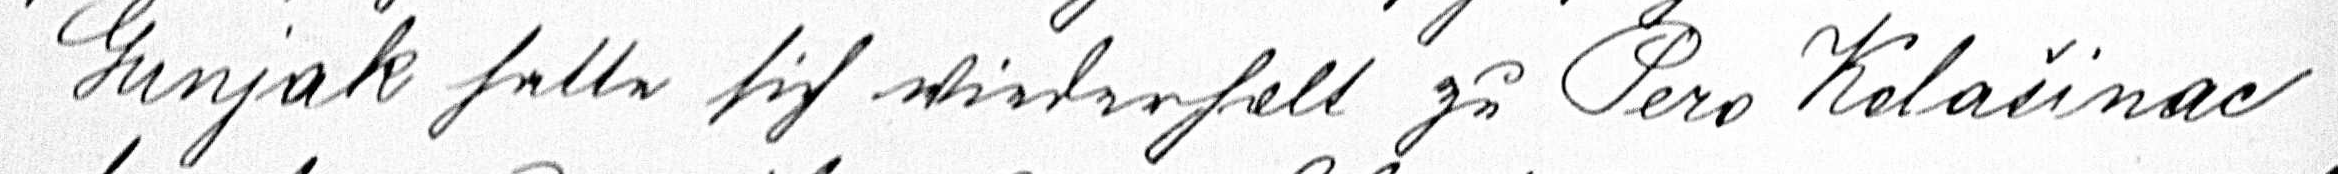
Gunjak hatte sich wiederholt zu Pero Kolašinac
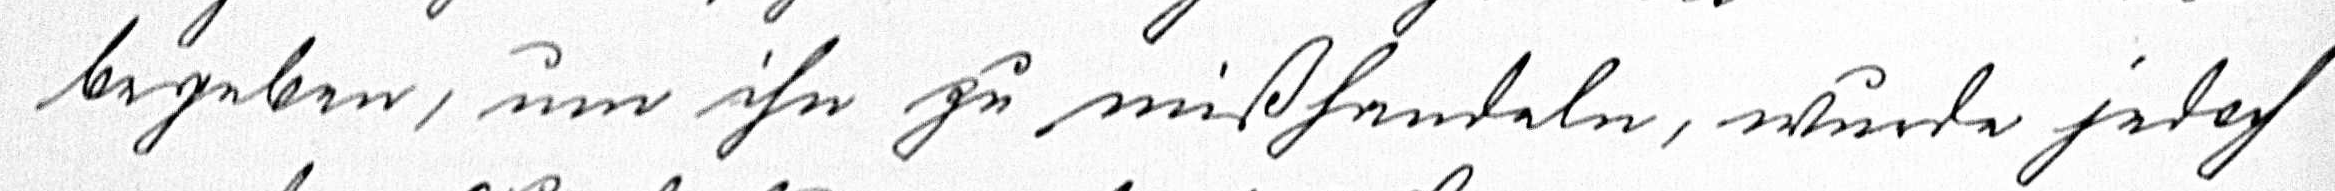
begeben, um ihn zu mißhandeln, wurde jeoch
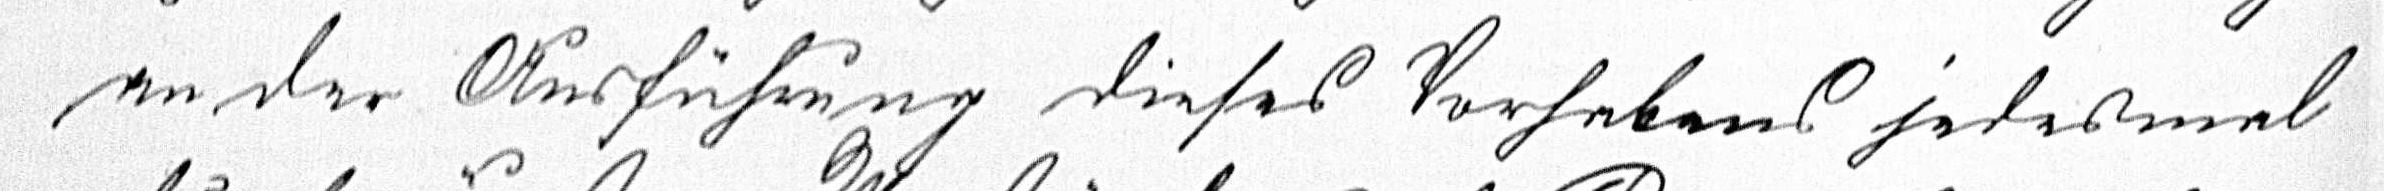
an der Ausführung dieses Vorhabens jedesmal
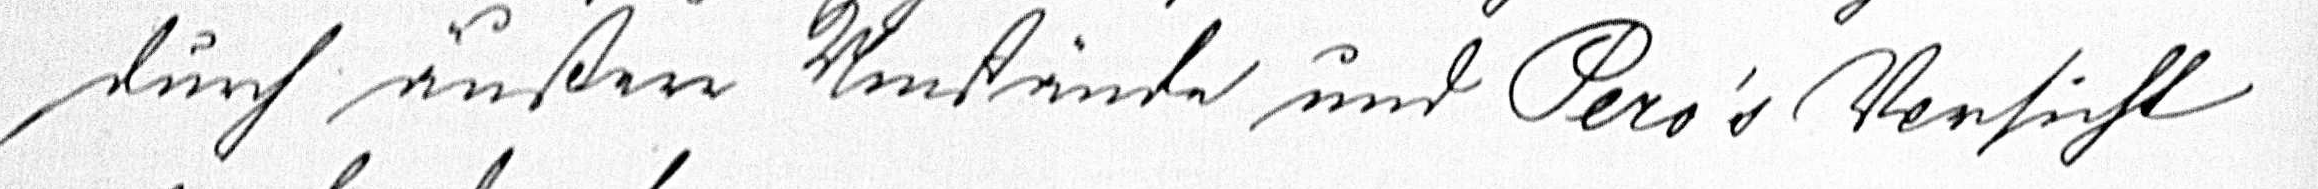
durch äußere Umstände und Pero’s Vorsicht
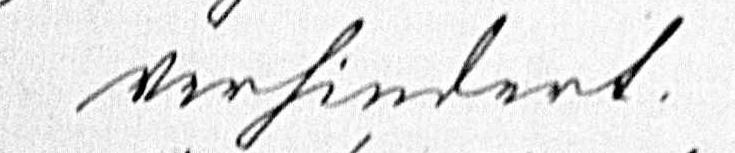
verhindert.
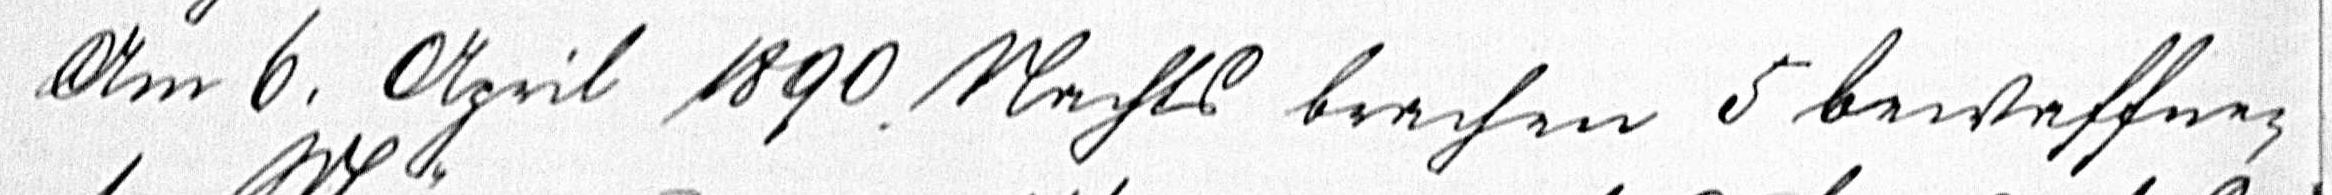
Am 6. April 1890 Nachts brachen 5 bewaffnete
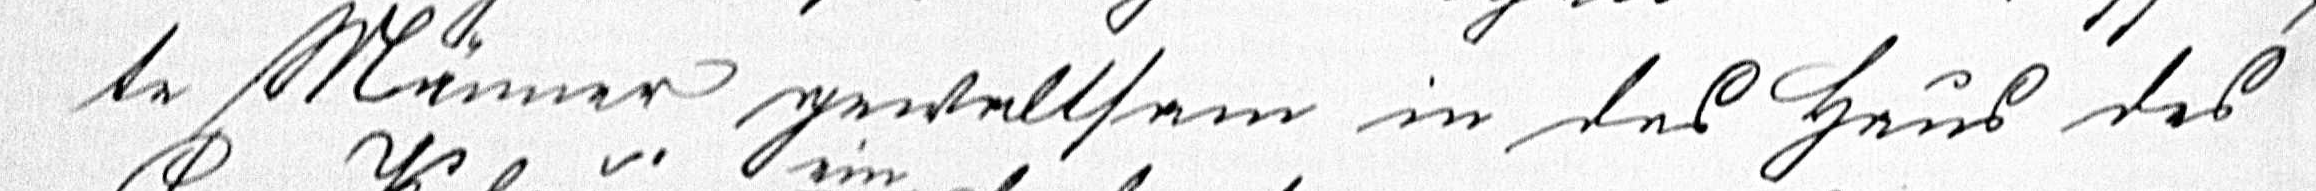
Männer gewaltsam in das Haus des
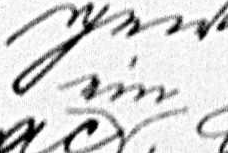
ein
